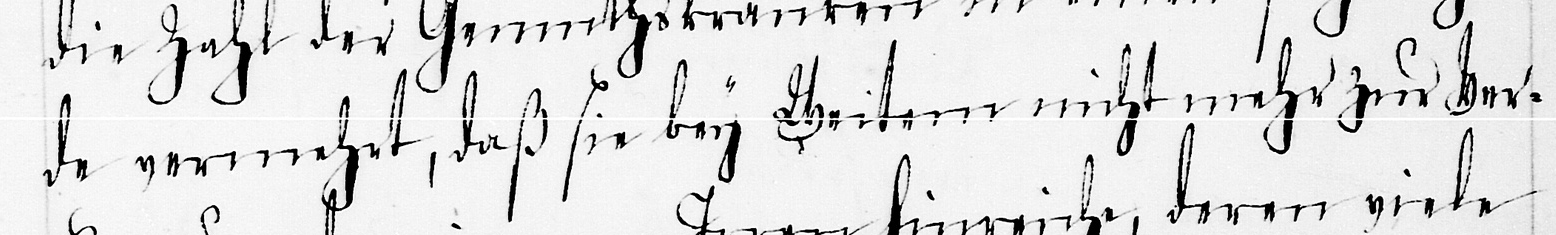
de vermehrt, daß sie bey Weitem nicht mehr zur Ver¬
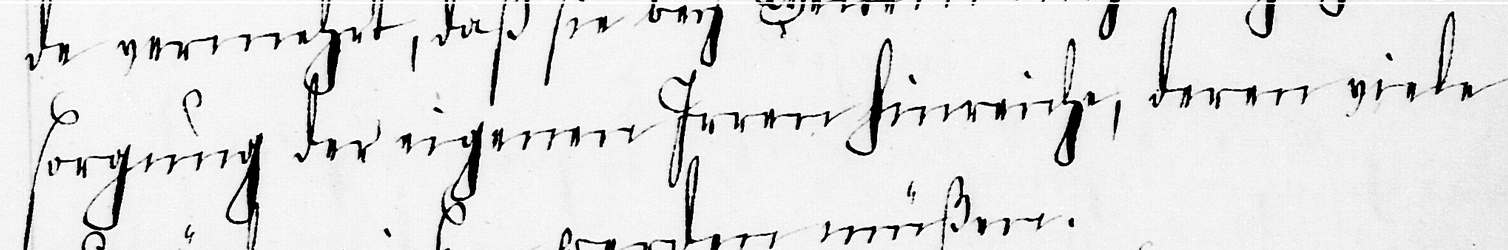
sorgung der eigenen Irren hinreiche, deren viele
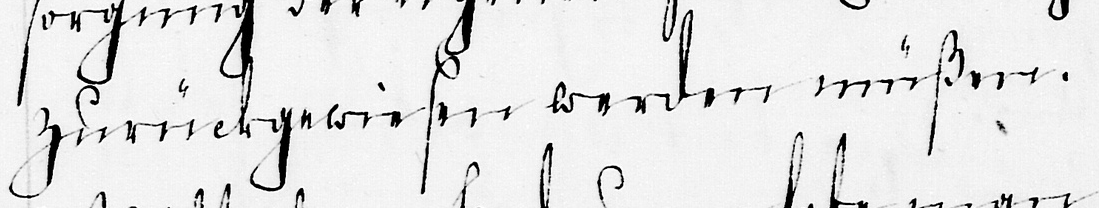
zurückgewiesen werden müßen.
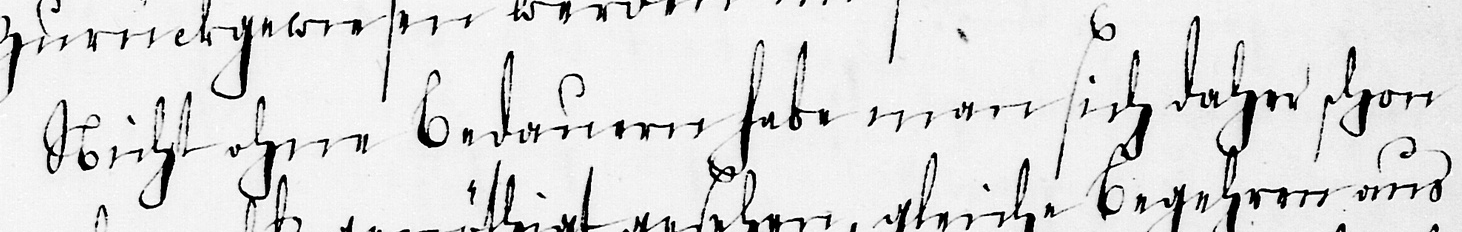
Nicht ohne Bedauern habe man sich daher schon
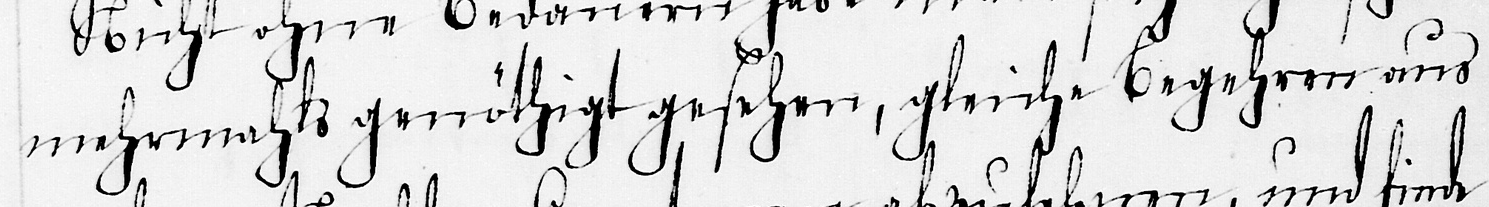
mehrmahls genöthigt gesehen, gleiche Begehren aus
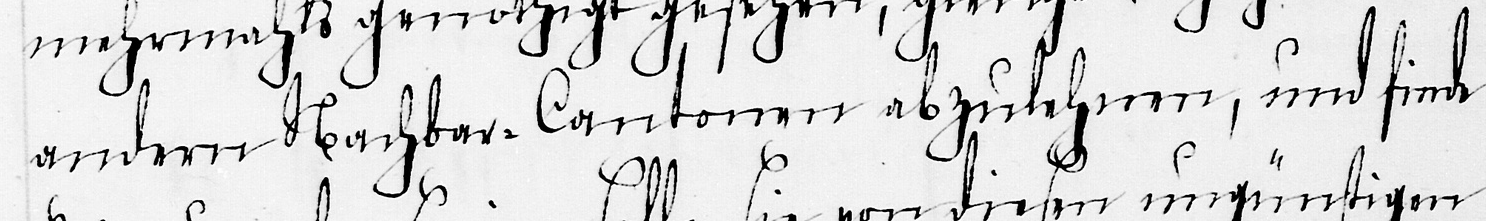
andern Nachbar-Cantonen abzulehnen, und finde
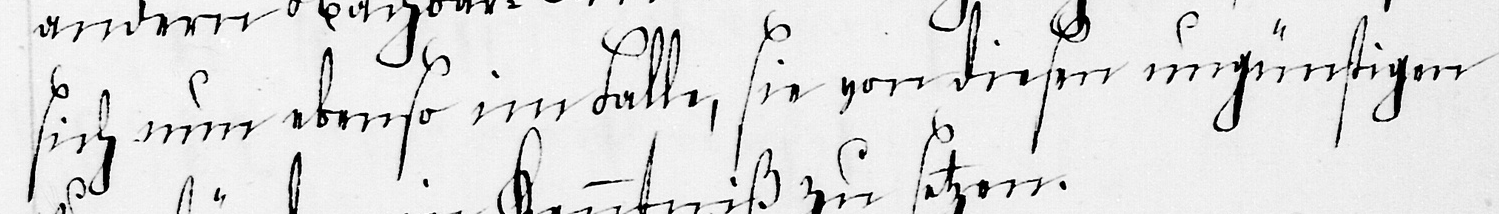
sich nun ebenso im Falle, sie von diesen ungünstigen
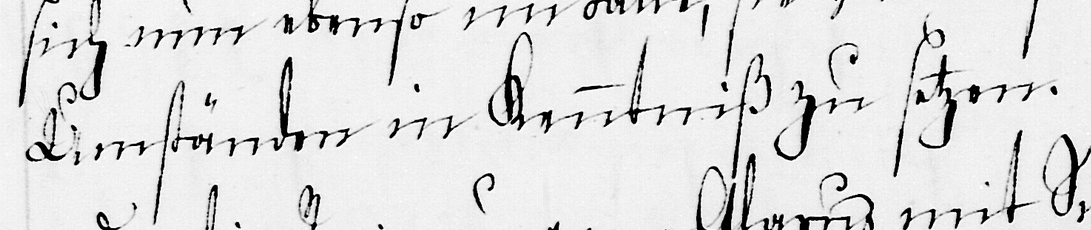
Umständen in Kenntniß zu setzen.
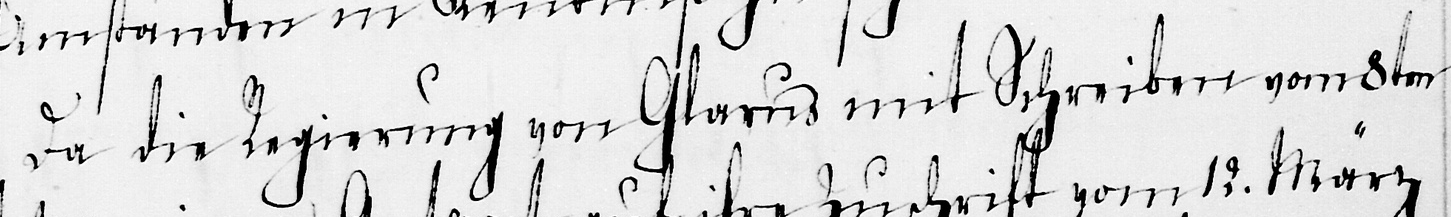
Da die Regierung von Glarus mit Schreiben vom 8ten
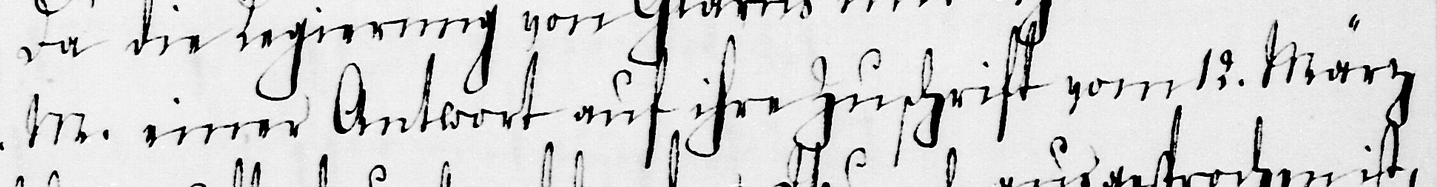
M. einer Antwort auf ihre Zuschrift vom 12. März
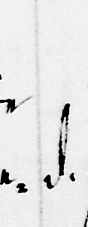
d.
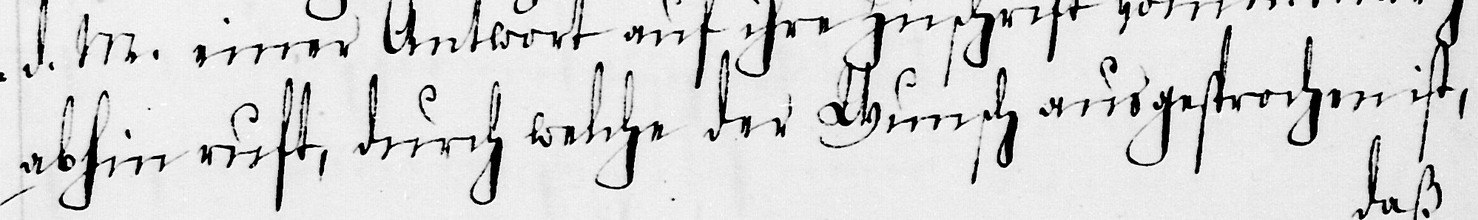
abhin ruft, durch welche der Wunsch ausgesprochen ist,
